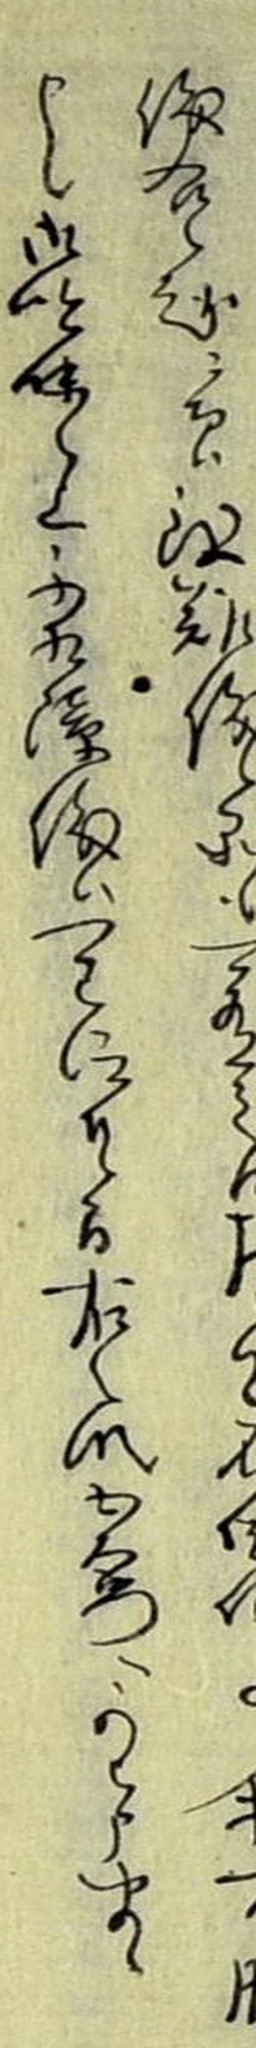申候御吟味之上不相障儀ハ可被仰付候間右之段五右衛門へ可被申聞候

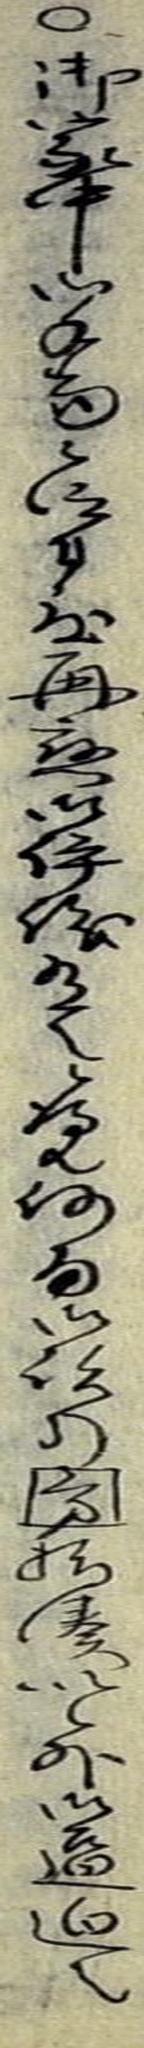〇御家中御手当被仰付度再応御評議有之候得共何角御引方指湊以之外御逼迫之
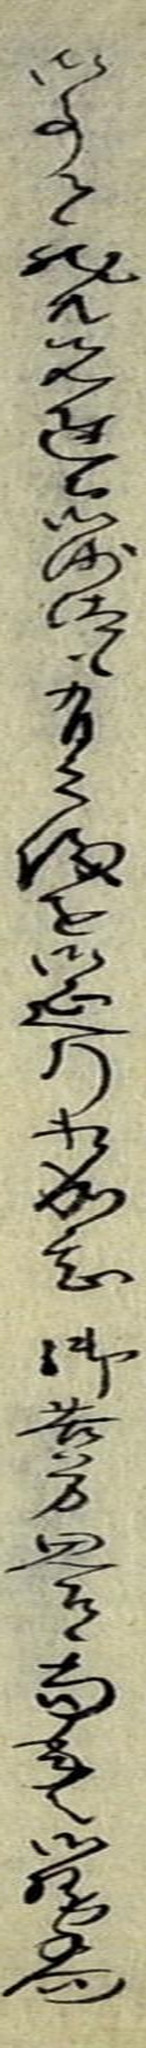御事ニ候然共先達而御沙汰も有之儀を御延引相成甚御苦労思召候当年之御勝手向
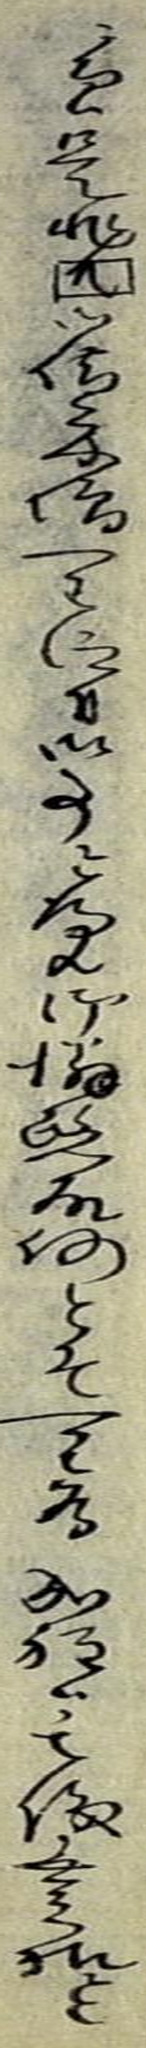ニ而ハ是非共御借米増可被仰付御事ニ候得共御憐愍故何とそ可被為成程ハ其儀無之様ニと
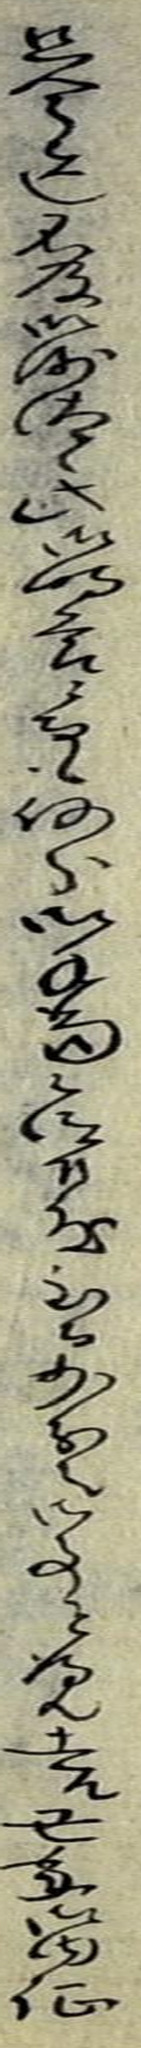只今迄不及御沙汰候此御時節ニ而も何分御手当被仰付度至而少分之御事ニ候得共去ル丑年御内証
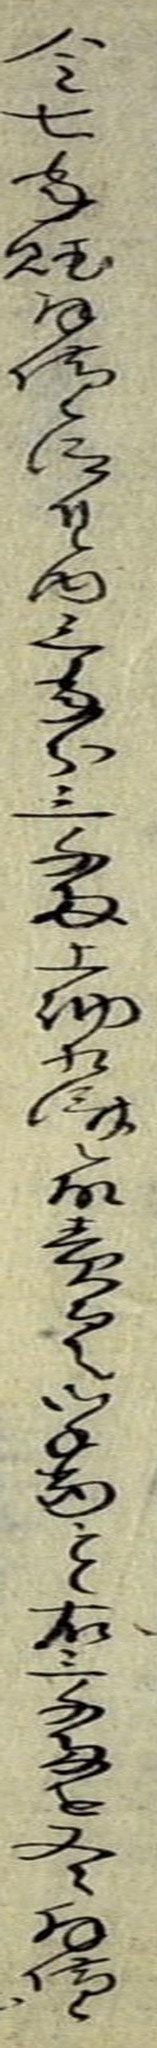金七年賦拝借被仰付候内三年分三千両上納相済候故責而之御手当ニと右三千両を又々拝借被
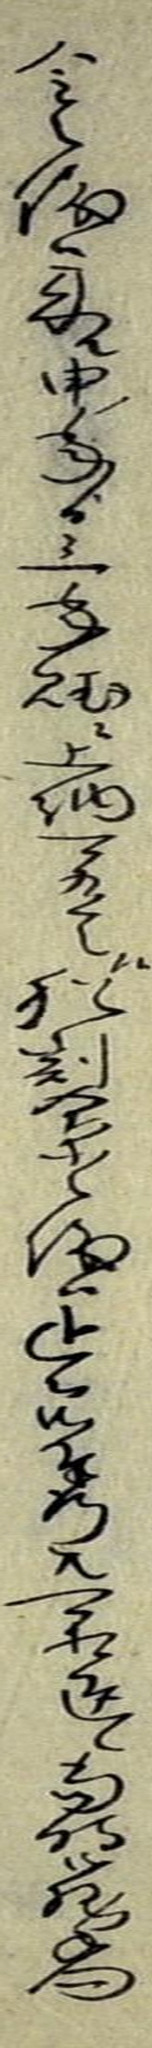金之儀ハ来ル申年ゟ三年賦ニ上納可有之候猶割合等之儀ハ追而御奉行共可相達候当時御勝手向
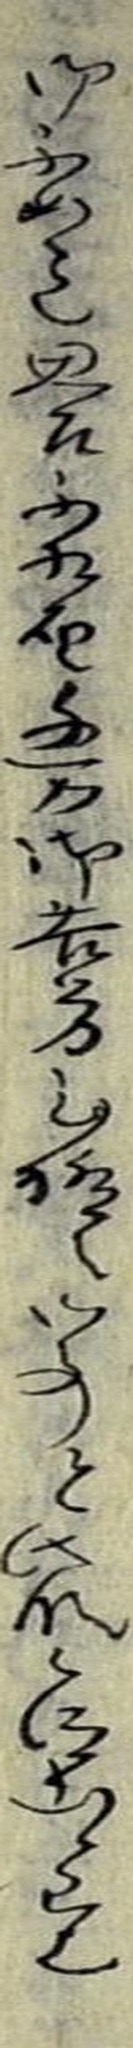御不如意思召不相届千万御苦労至極之御事ニ候此段被仰出候已上
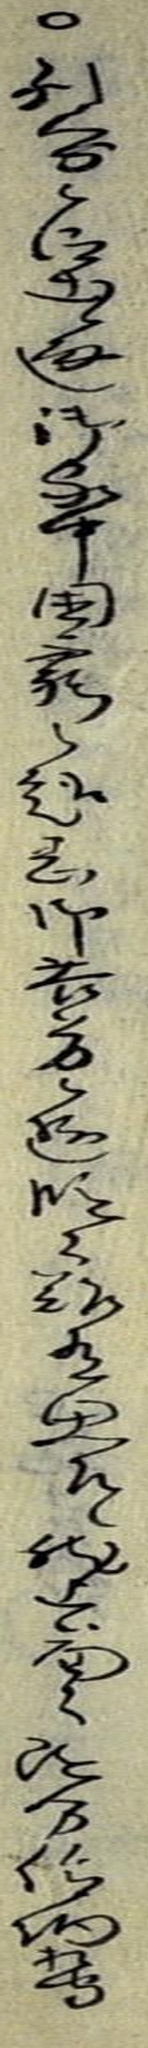〇別紙被仰出候通御家中困窮之趣甚御苦労被遊段々難有思召候然上ハ面々随分倹約相守
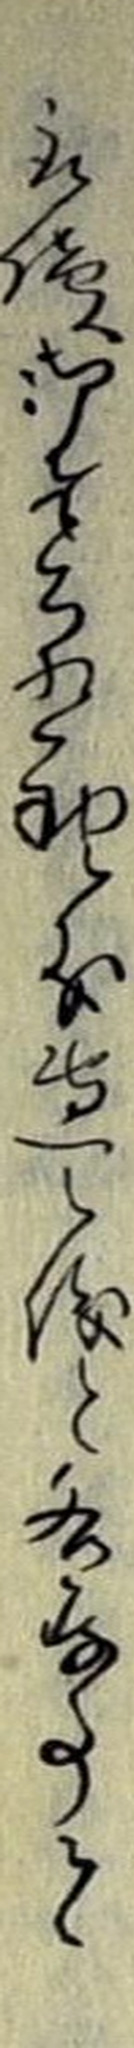取続御奉公相勤候義専一之儀と各存事ニ候
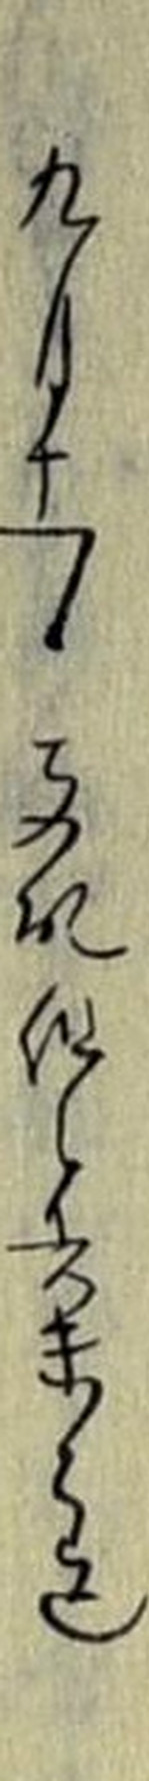九月十一日支配組之者末々迄
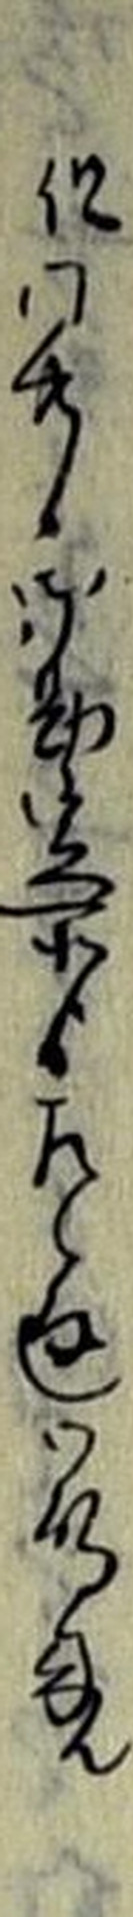但同廿日御勘定所ゟ左之通御触来ル
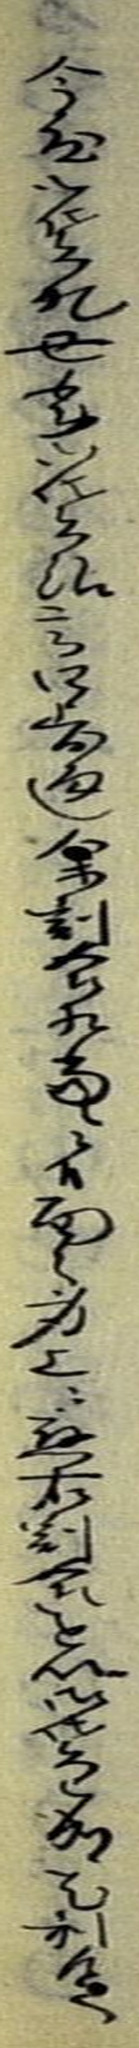今度御貸札丑年御貸銀高四歩通余割合相当ニ付面々身上ニ応右割合を以御貸被成候尤利足
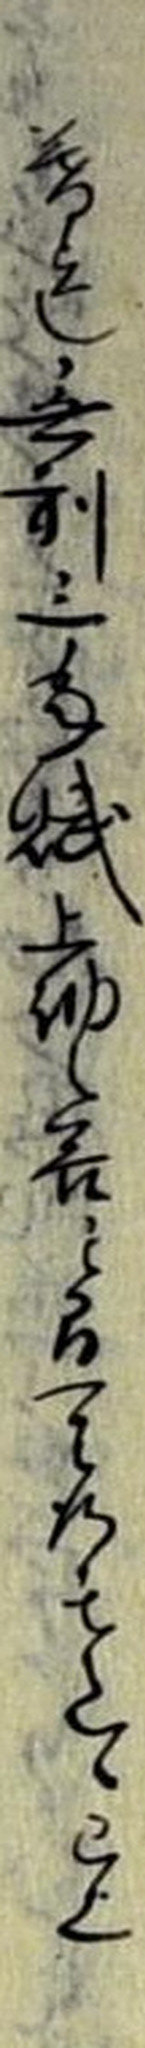暮迄無別三年賦上納之筈ニ候間可被得其意候已上
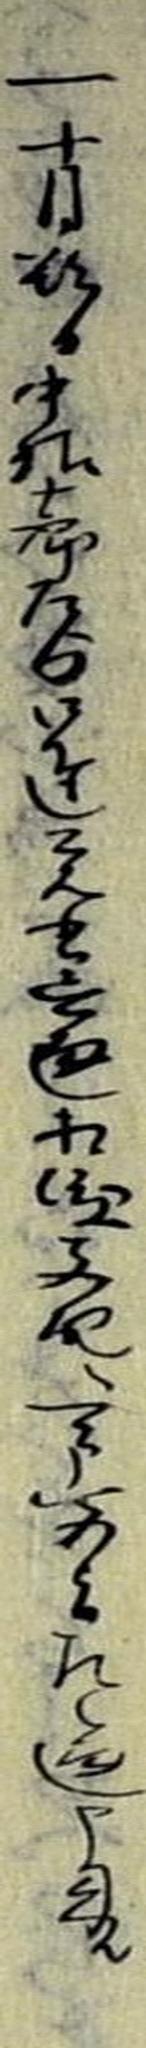一十月朔日中根十郎左衛門口達覚書壱通相渡支配へ可申聞旨左之通申来ル
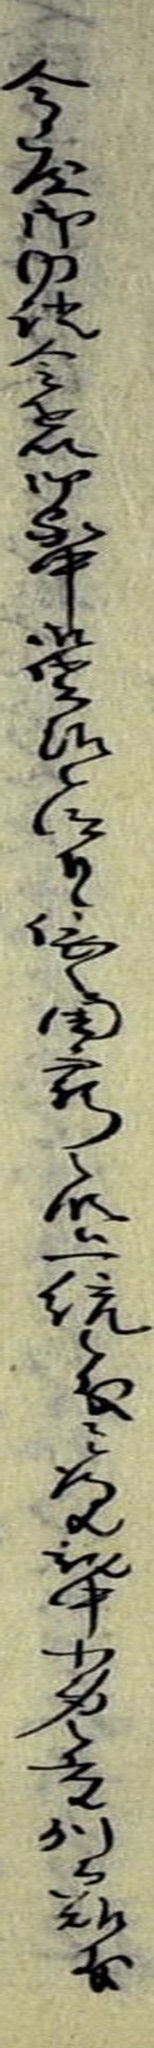今度御内証金を以御家中御貸銀被仰付候依之困窮之段ハ一統之義ニ候得共就中小身之者も別而難義
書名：命令之部 一
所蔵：福井県文書館 Fukui Prefectural Archives
